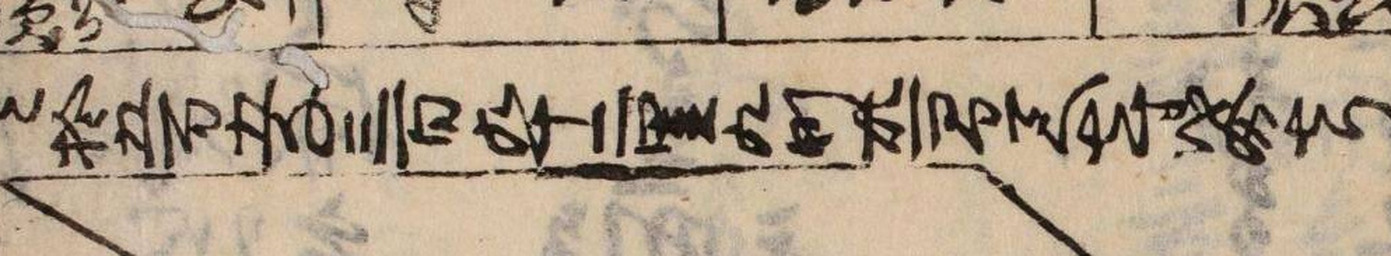拾五万五千三百九十二里九町卅一間一尺七寸弐分七り毛有

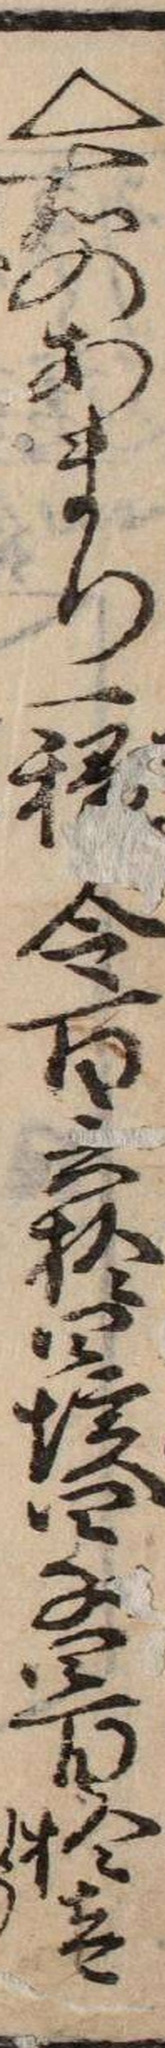△右のあまり一杼令百六拾四垓四千四百拾壱
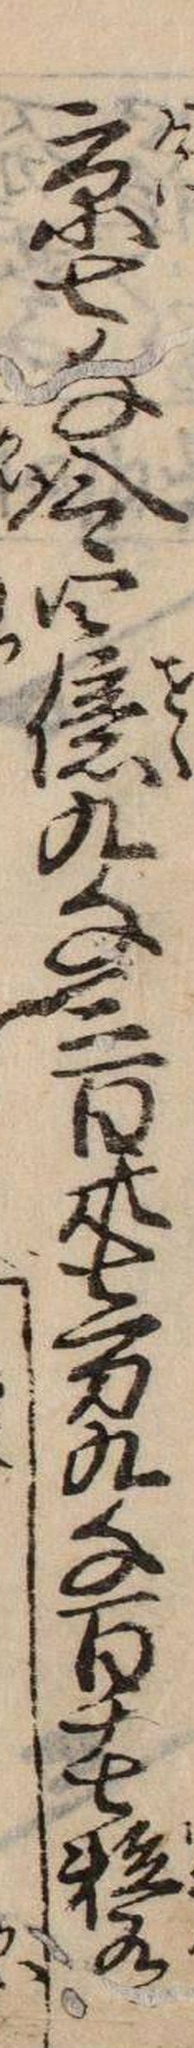京七千令四億九千三百卅七万九千百十七粒有
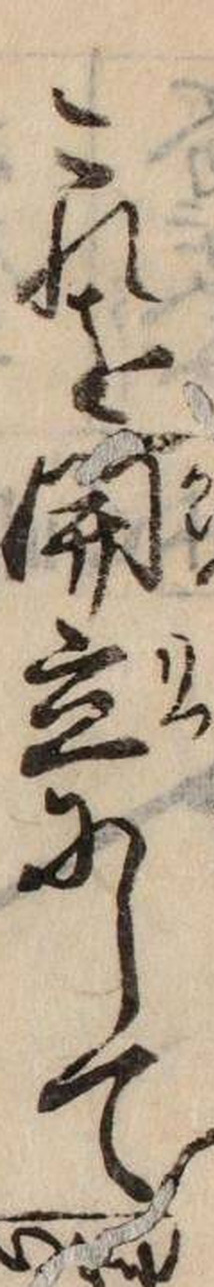これを開立にして
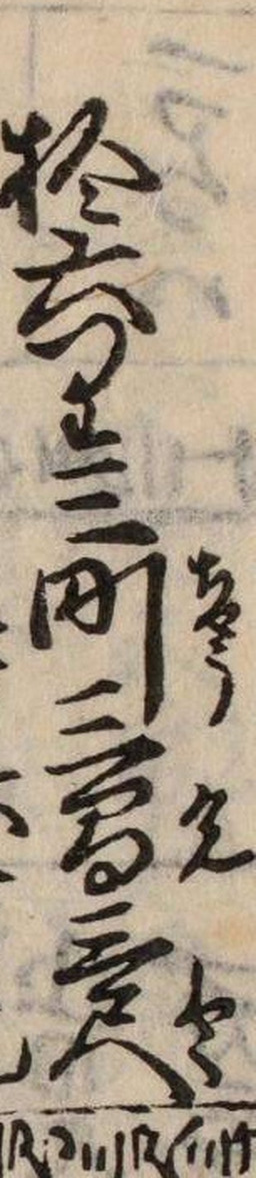拾六里三町三間三尺
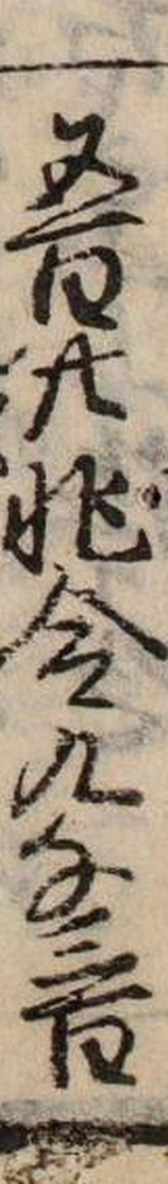[五百廿兆令九千三百]
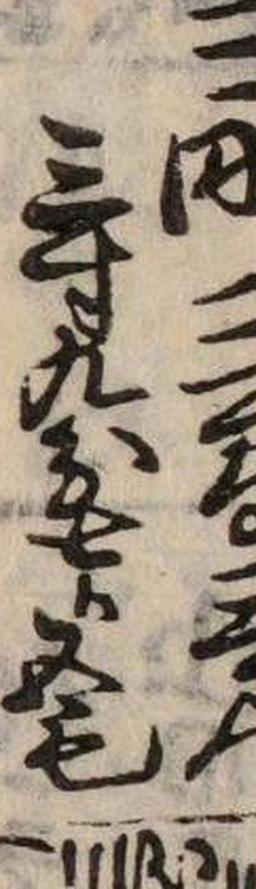三寸九分七り五毛
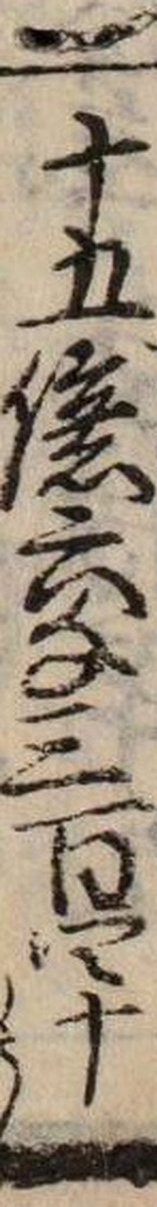[十五億六千三百四十]
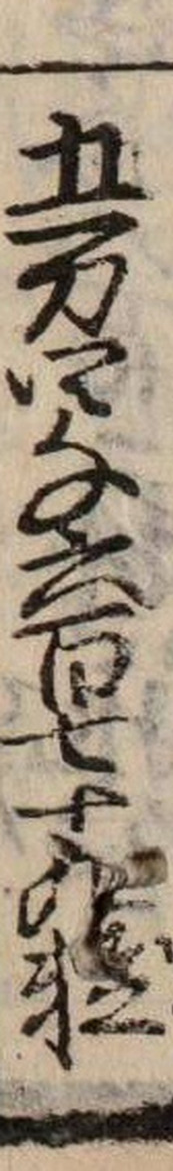[五万四千六百七十九粒]
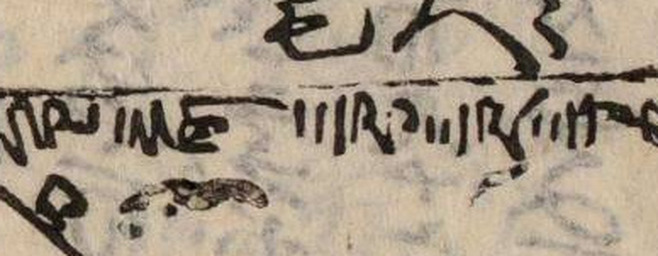拾六里三町三間三尺
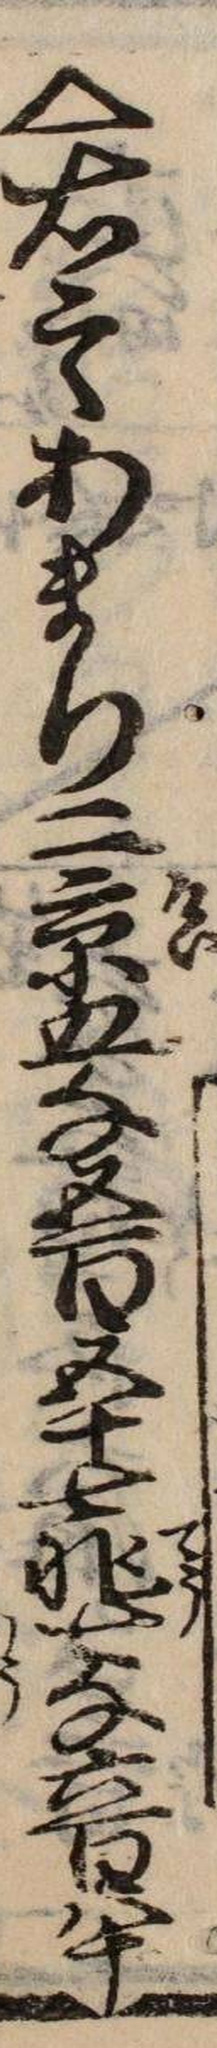△右之あまり三京五千五百五十七兆七千六百八十
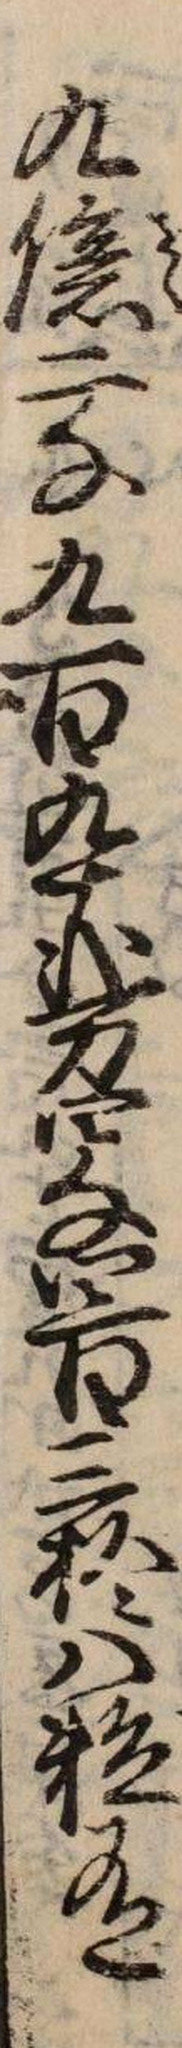九億二千九百九十弐万四千四百三拾八粒有
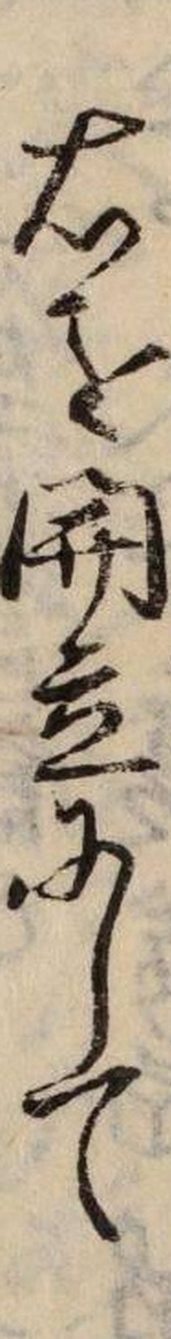右を開立にして
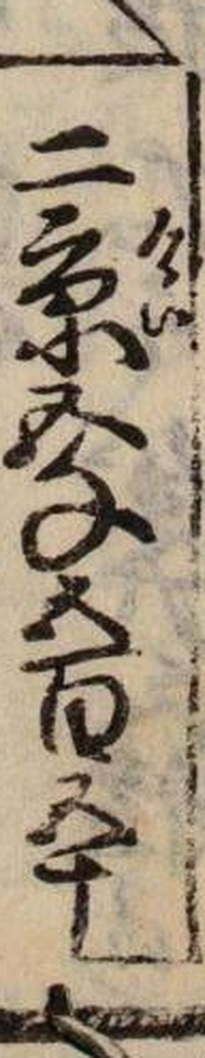[二京五千五百五十]
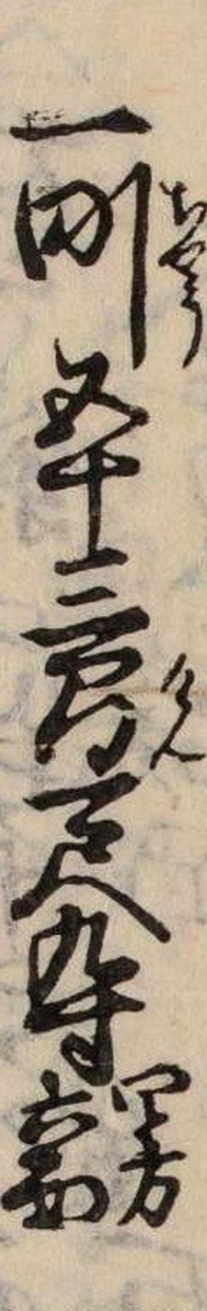一町五十三間一尺九寸四方六面
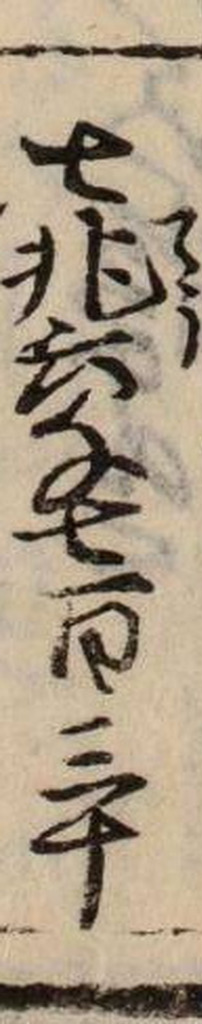[七兆六千七百三十]
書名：塵劫記（寛永11年自跋、京都府立京都学・歴彩館追貴8）
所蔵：京都府立京都学・歴彩館 国文学研究資料館
